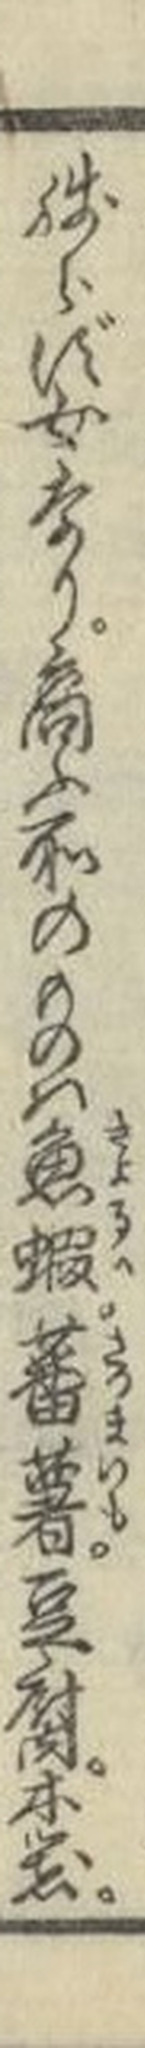残らず女なり。商ふ所のものは魚蝦。蕃薯。豆腐。木器。
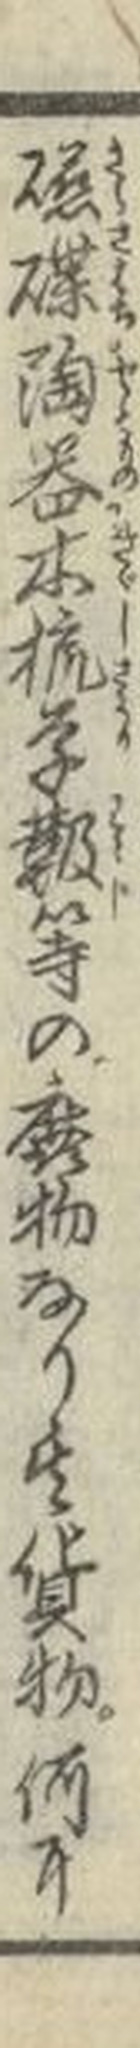礠碟陶器。木梳草靸等の。麤物なり其貨物。何に
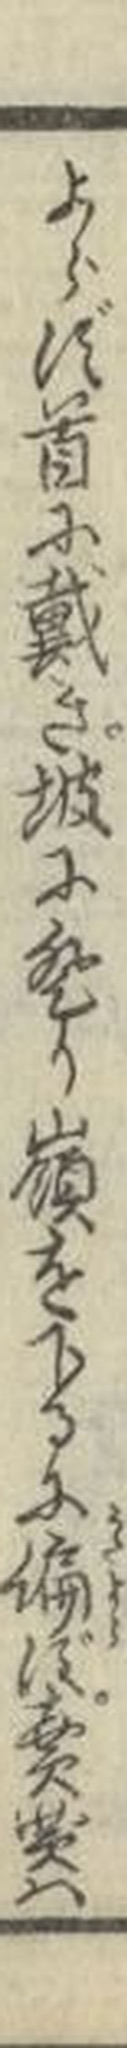よらず首に戴き。坡に登り嶺を下るに偏ず。売買は
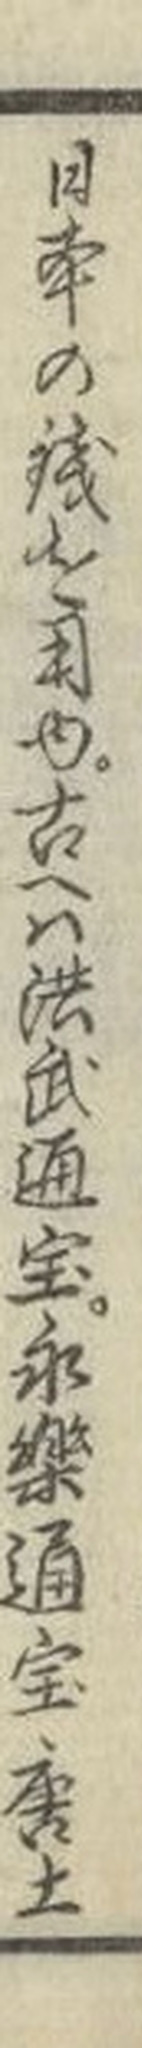日本の銭を用ゆ。古へは洪武通宝。永楽通宝唐土
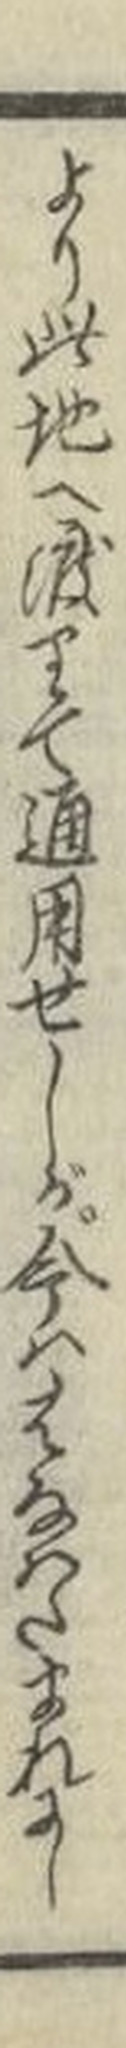より此地へ渡りて通用せしが。今ははなはたまれにし
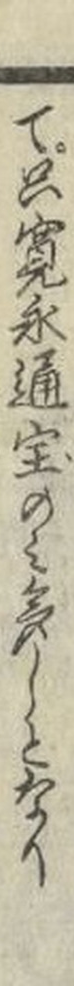て。只寛永通宝のみ多しとなり
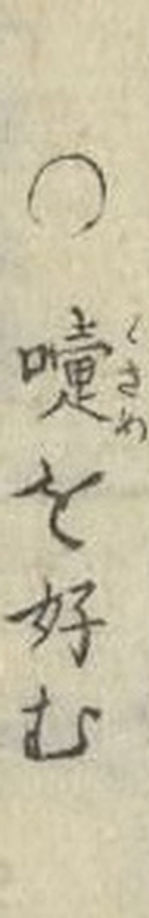○嚏を好む
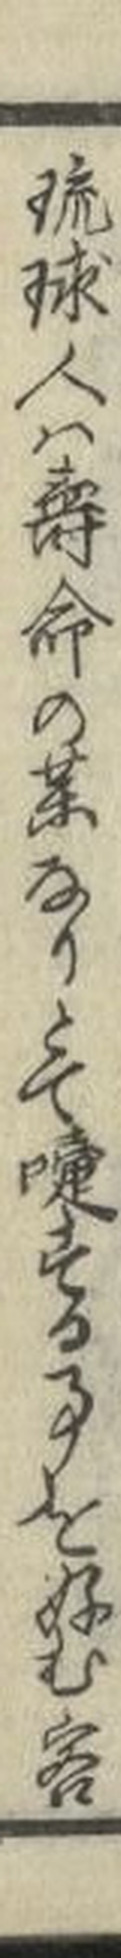琉球人は寿命の薬なりとて嚏する事を好む客

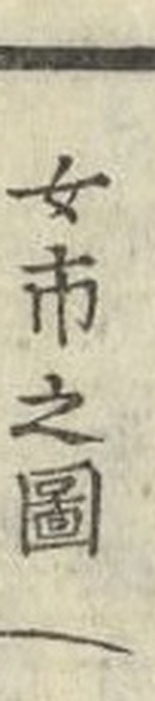女市之図

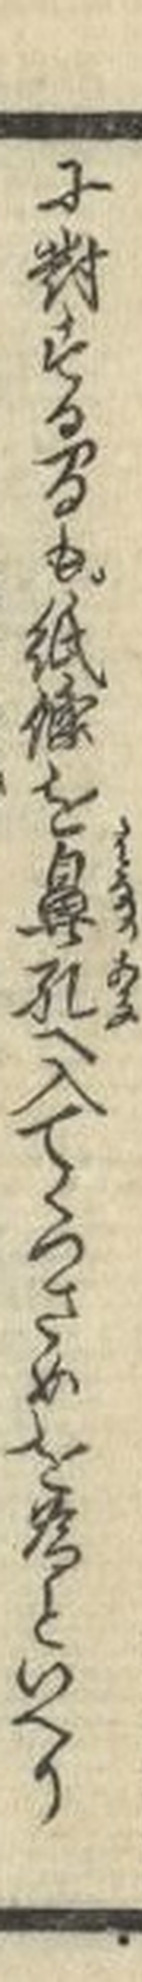に対する間も。紙条を鼻孔へ入てくつさめを為すといへり
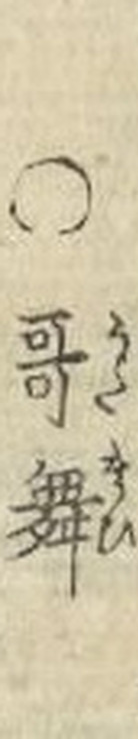○哥舞
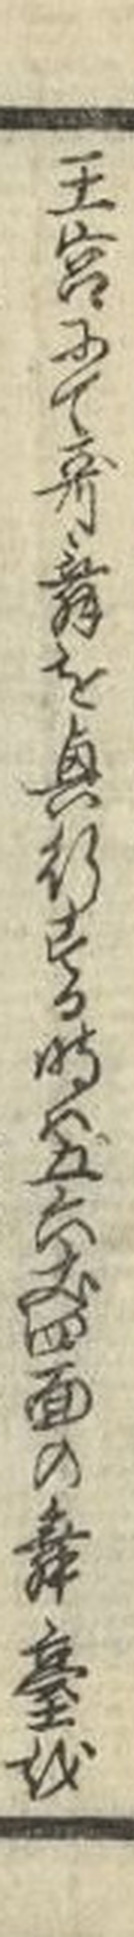王宮にて哥舞を興行する時は。五六丈四面の舞台を
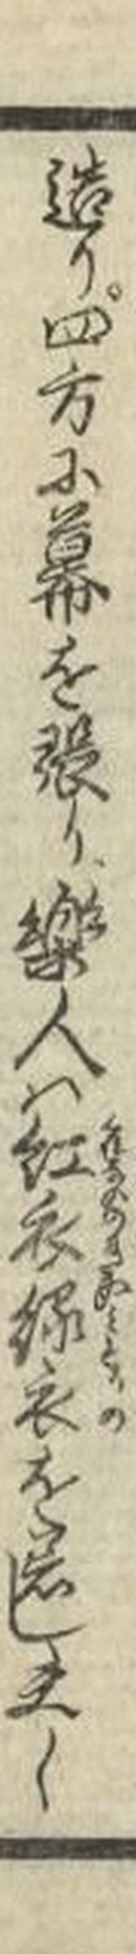造り。四方に幕を張り。楽人は紅衣緑衣を着し夫〳〵
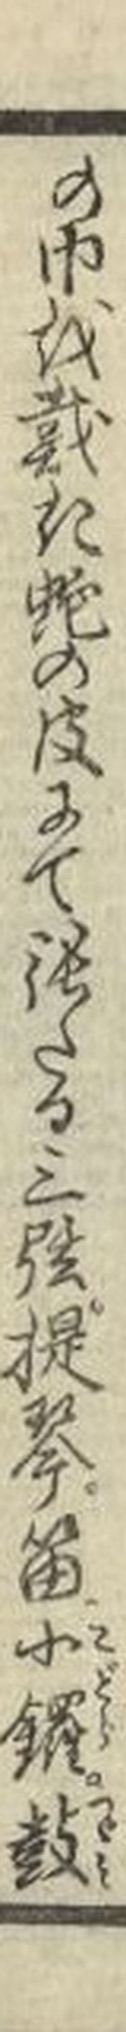の巾を戴き蛇の皮にて張たる三弦。提琴。笛。小鑼。鼓
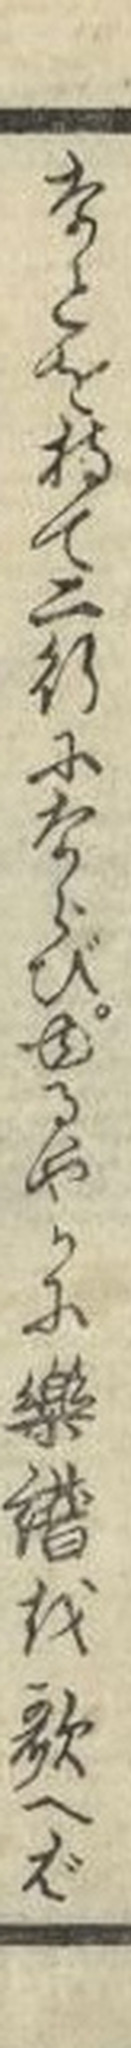なとを持て二行にならび。ゆるやかに楽譜を歌へば
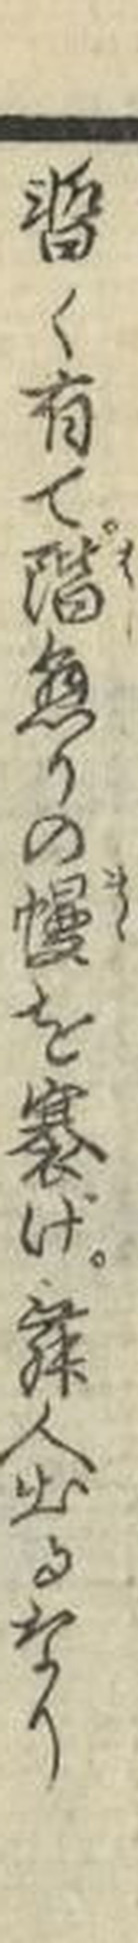暫く有て。階懸りの幔を褰げ。舞人出るなり
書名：琉球解語
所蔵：University of the Ryukyus Library
